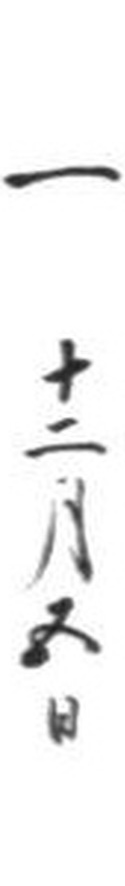一十二月五日
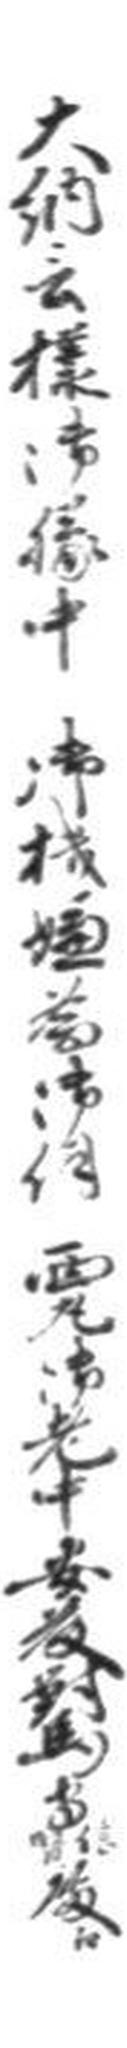大納言様御縁中御機嫌為御伺西丸御老中安藤対馬守信賢殿江
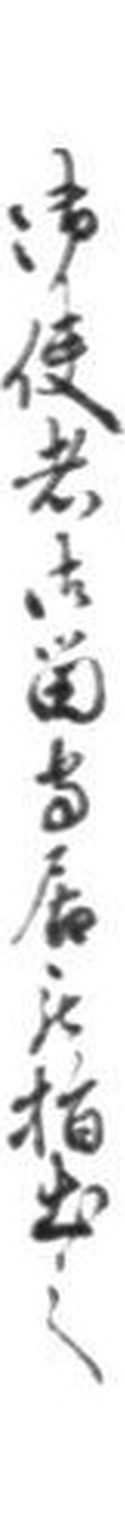御使者御留守居被指出之
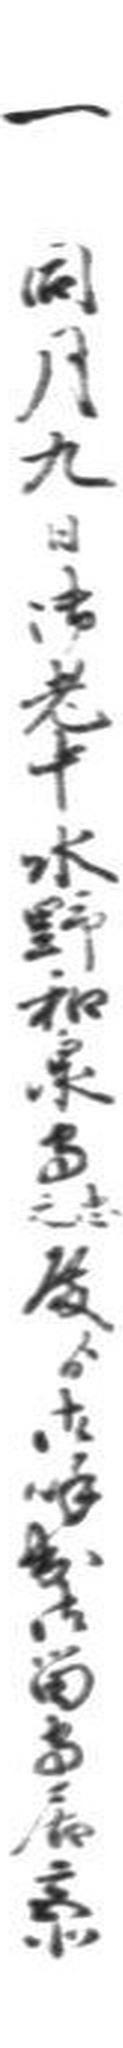一同月九日御老中水野和泉守忠之殿ゟ御呼出御留守居宮北
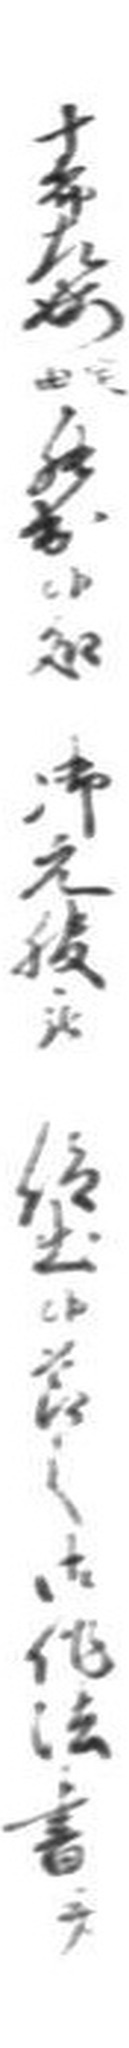十郎左衛門定由罷出候処御元服被仰出候節之御作法書幷
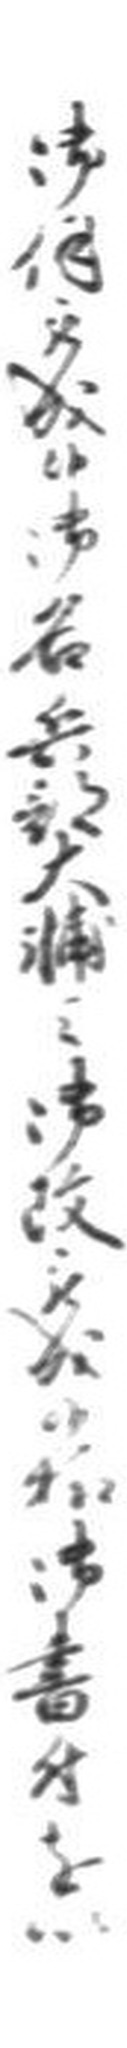御伺被成候御名兵部大輔与御改被成候様御書付を以
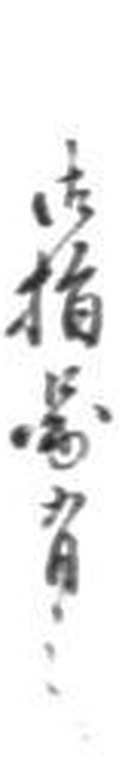御指図有之
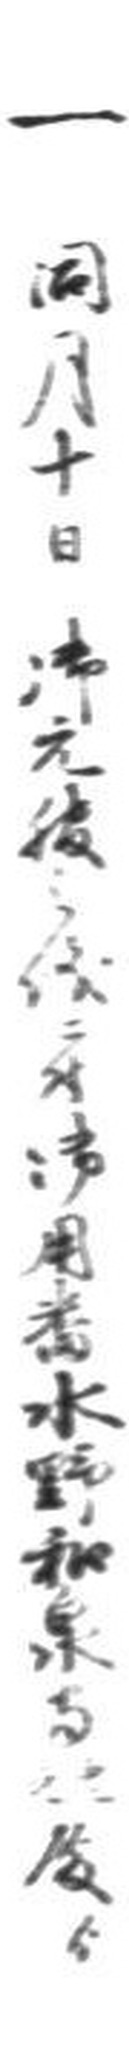一同月十日御元服之儀ニ付御用番水野和泉守忠之殿ゟ
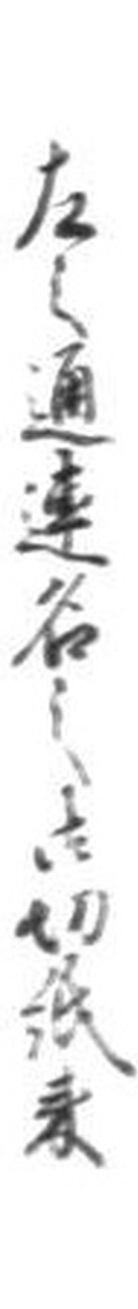左之通連名之御切紙来
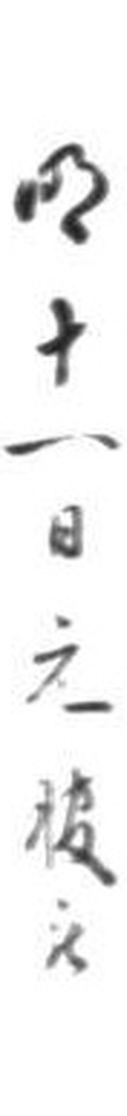明十一日元服被
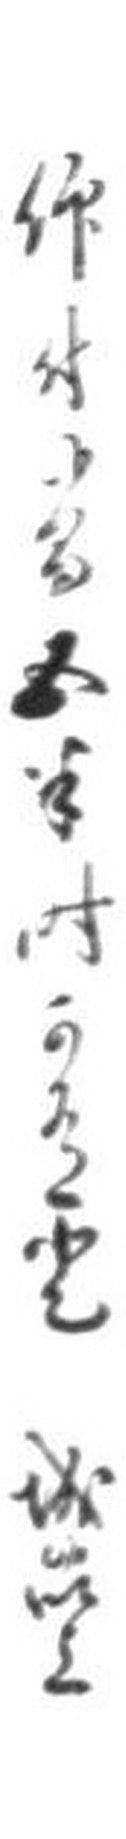仰付候間五半時可有登城候以上
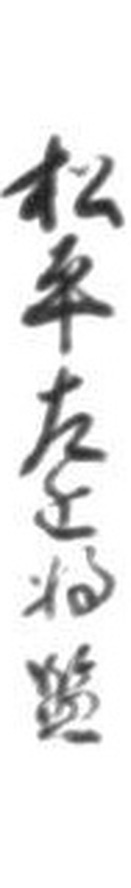松平左近将監

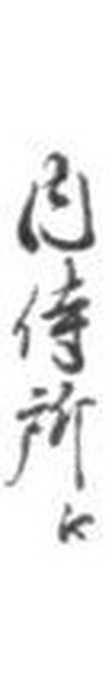内侍所江
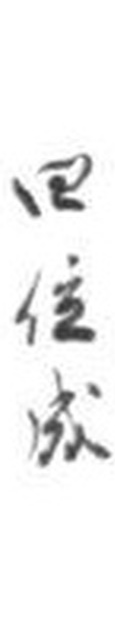四位成
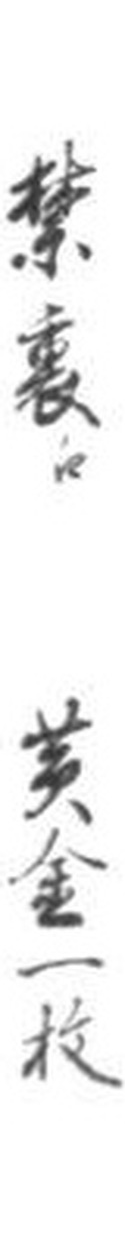禁裏江黄金一枚
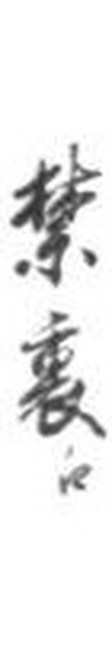禁裏江
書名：家譜 四十 宗矩公 従享保十一年到享保十二年
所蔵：福井県文書館 Fukui Prefectural Archives
